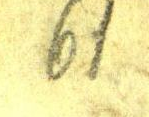61
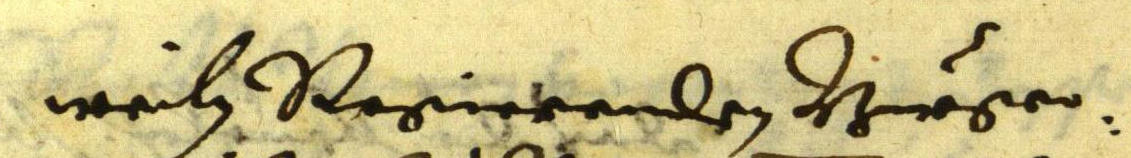weiln Regierenden Būrger¬
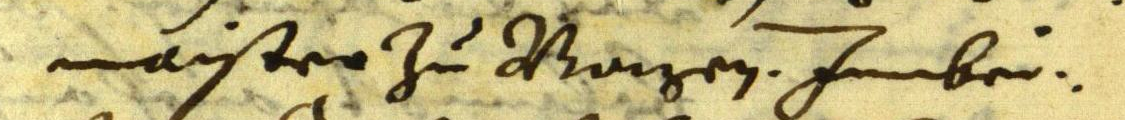maister Zū Bozen. Innbei¬
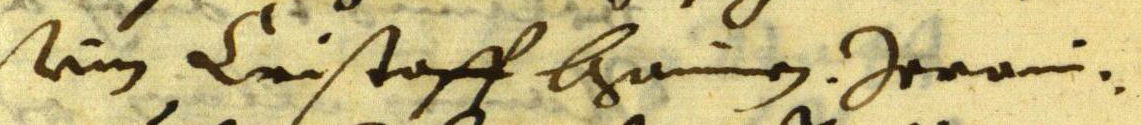sein Cristoff Haimen. Jeroni¬
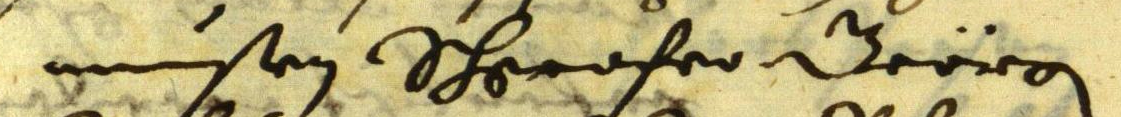mūsen Schgrafer Geörg
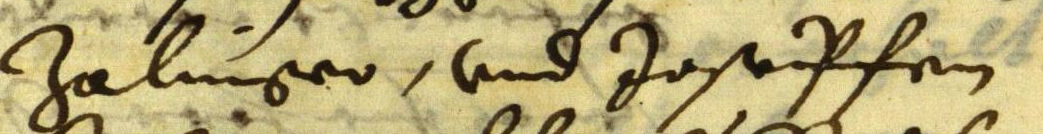Zalinger, vnd Joseffen
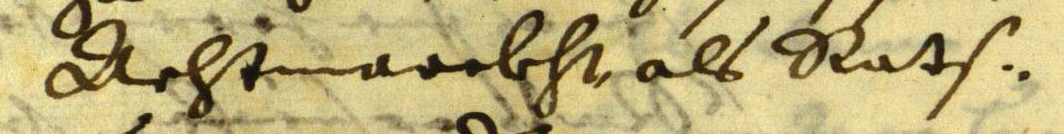Achtmarckht, als Rats¬
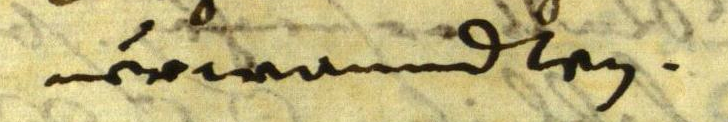vērwanndten.
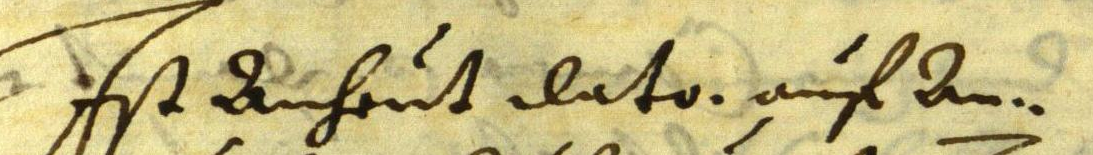Ist Anheūt dato. aūf An¬
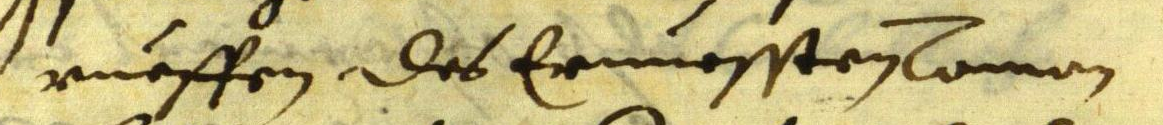rūeffen des Ernūessten Toman
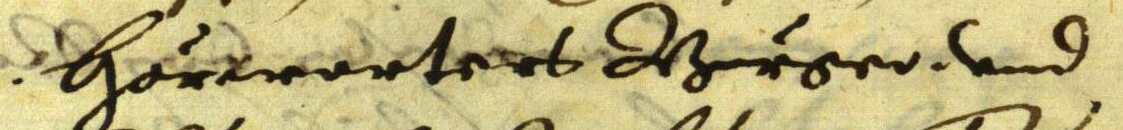Hōrwarters Būrger. vnd
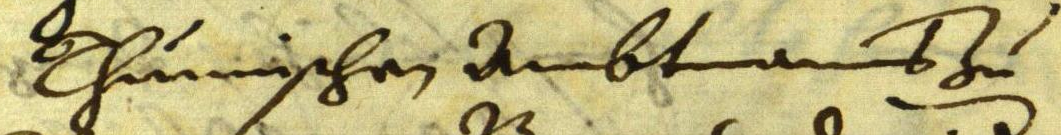Thūnischen Ambtmanns Zū
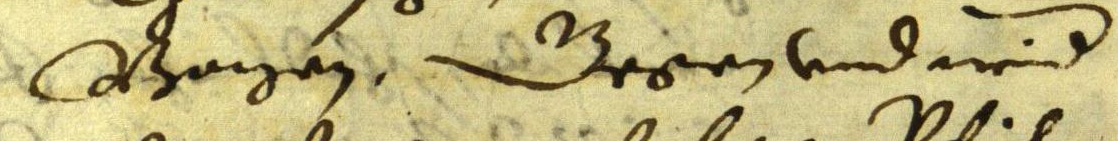Bozen. Gegen vnd wid
